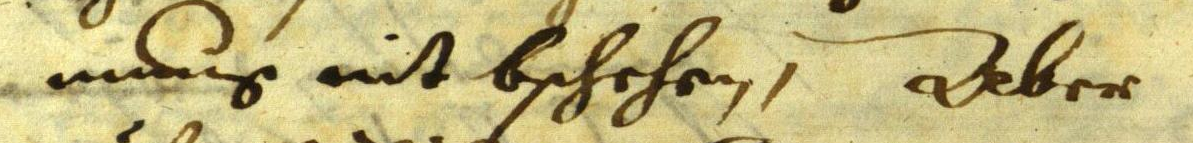nūng nit beschehen, Aber
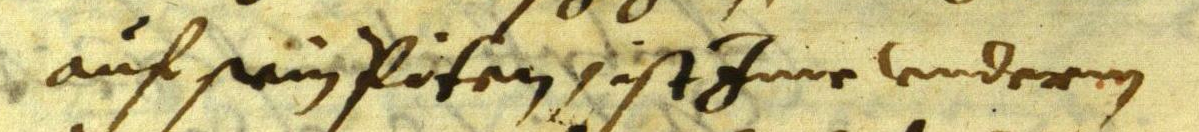aūf sein Piten, ist Ime vnderm
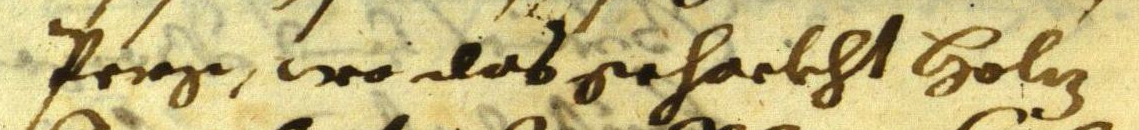Perg, wo das gehackht Holz
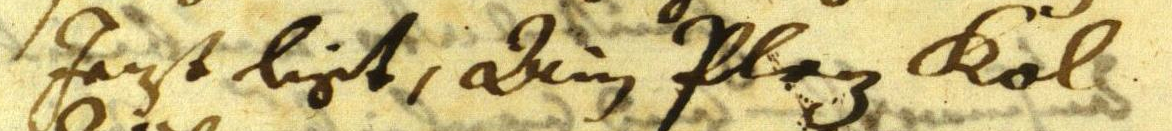Jezt ligt, Ain Plaz Kol
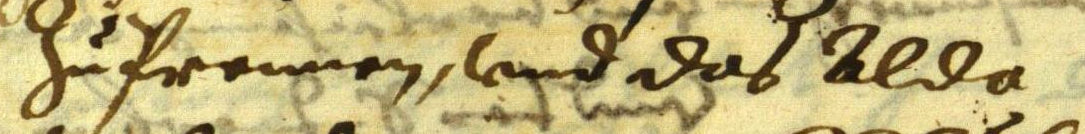Zū Prennen, vnd das Alda
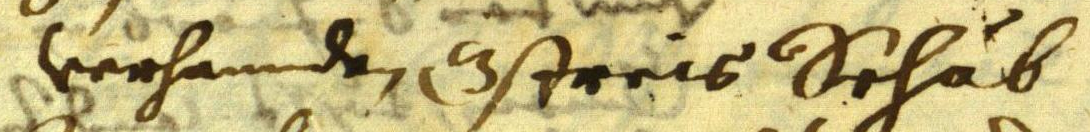verhannden Gstreig Schāb
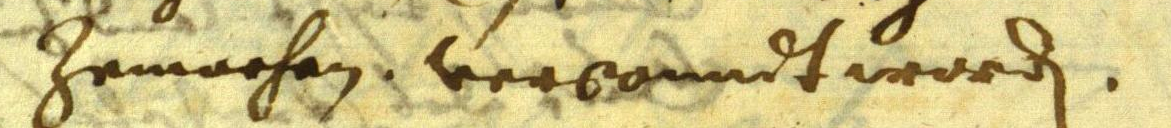Zemachen. vergonndt word.
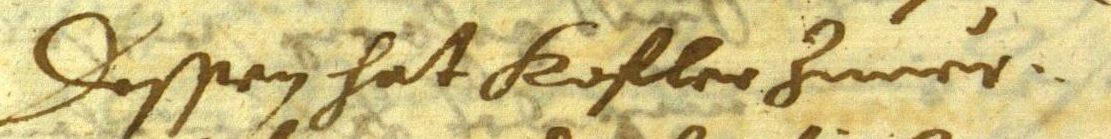Dessen hat Kofler Zūeuēr¬
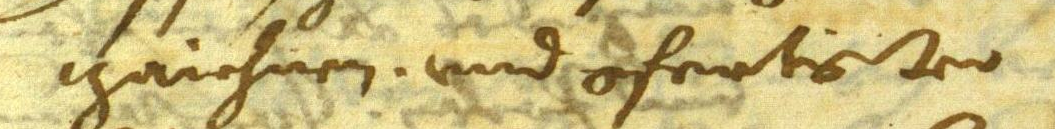zaichnen. vnd gfertigter
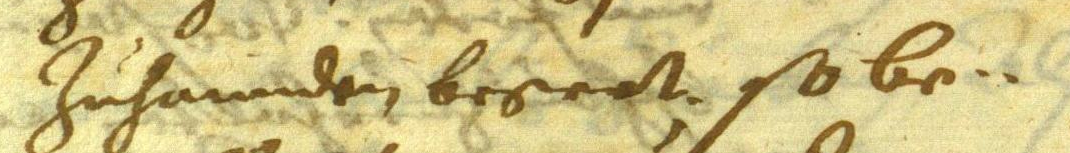Zūhannden begert. so be¬
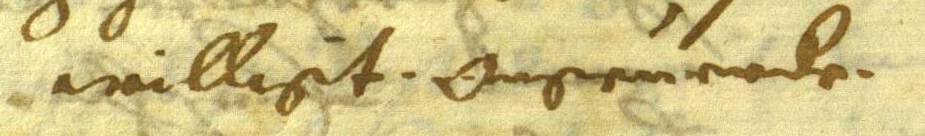willigt. Ongeūerde.
